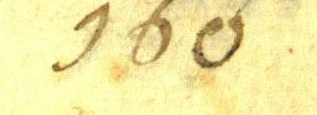160
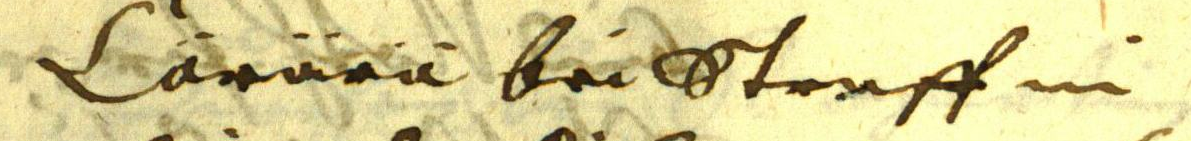Cärärä bei Straff in
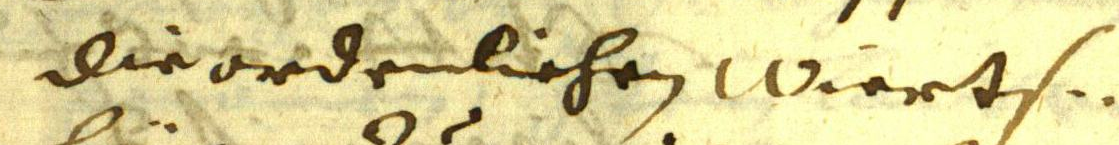die ordenlichen Wierts¬
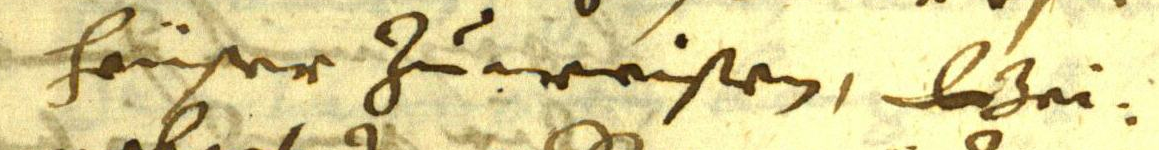heüser Zū weisen, Er Zei¬
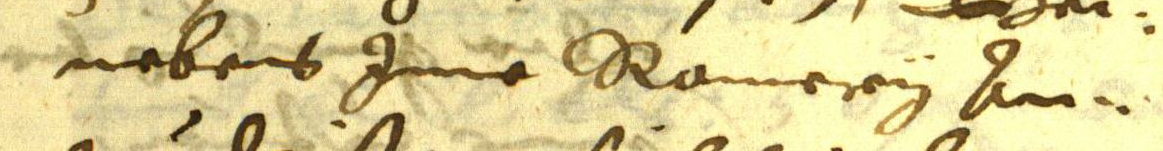nebens Ime Romerÿ An¬
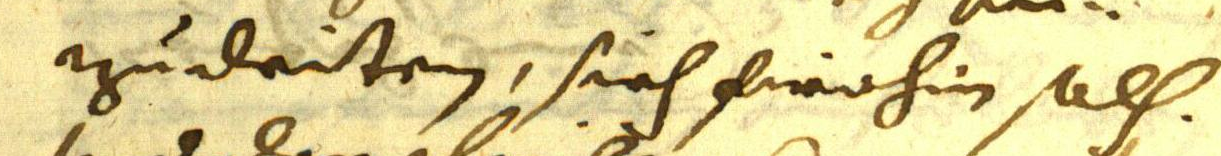zū deiten, sich firohin solh.
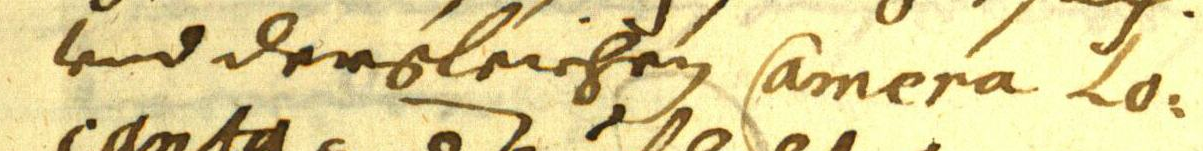vnd dergleichen Camera Lo¬
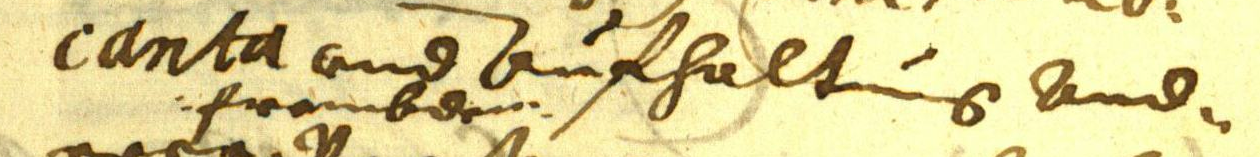canta vnd Aūfhaltūng And¬
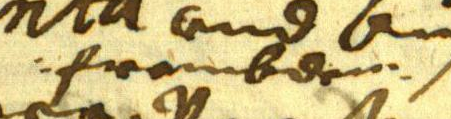:rembder:
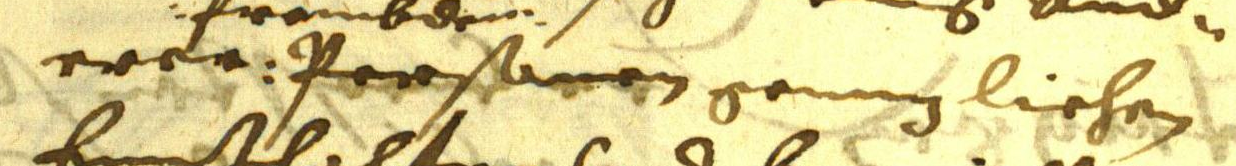erer : Personen gennz lichen
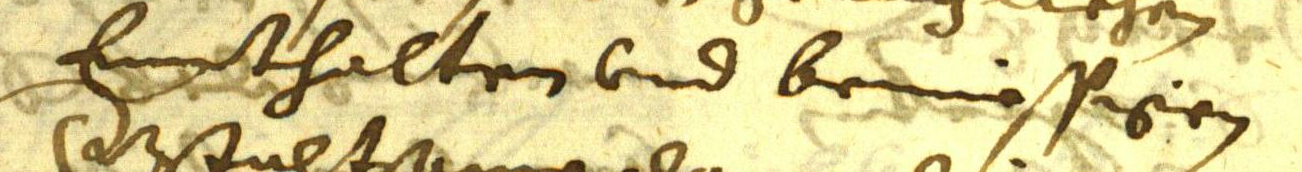Ennthalten vnd bemiessigen
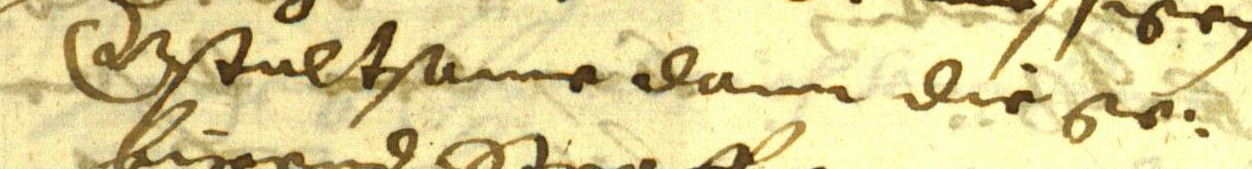Gstaltsame dann die ge¬
